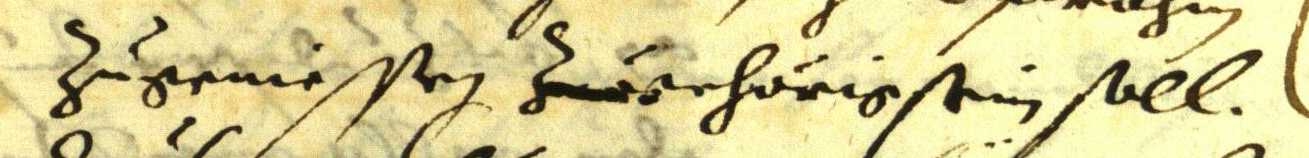Zūgeniessen Zūe gehörig sein soll.
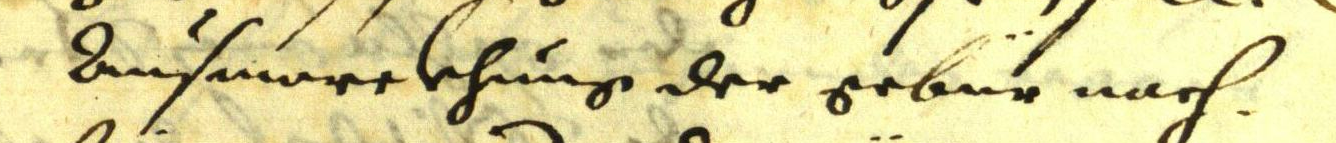Aūsmarckhūng der gebür noch
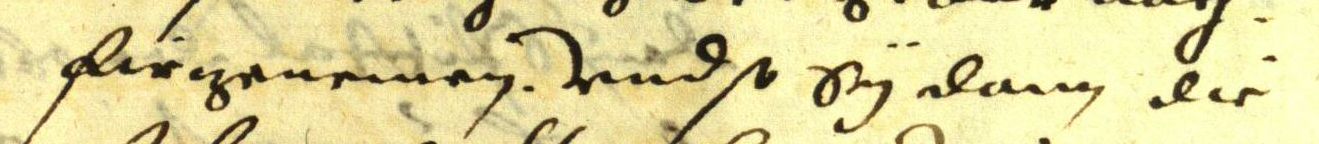firzenemen. Vnd so Sÿ dann die
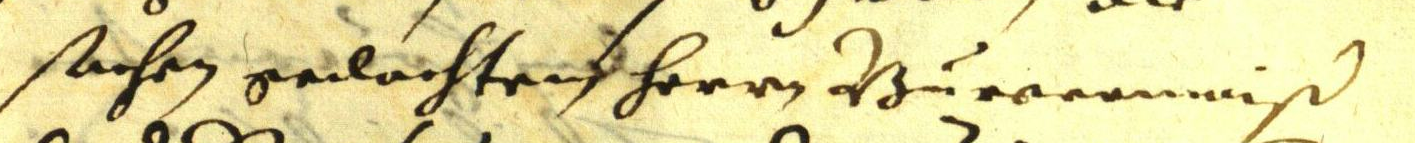sachen gedachten herrn Būrgermaist
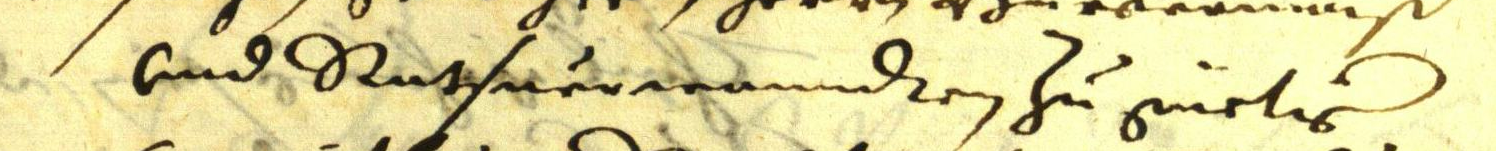vnd Ratsuērwanndten Zū güetig
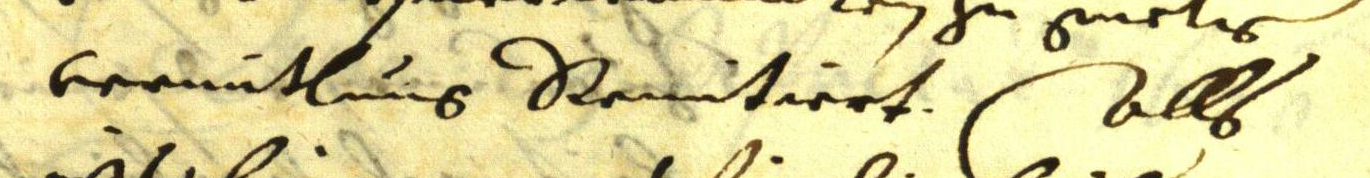vermitlūng Remitiert. Alls
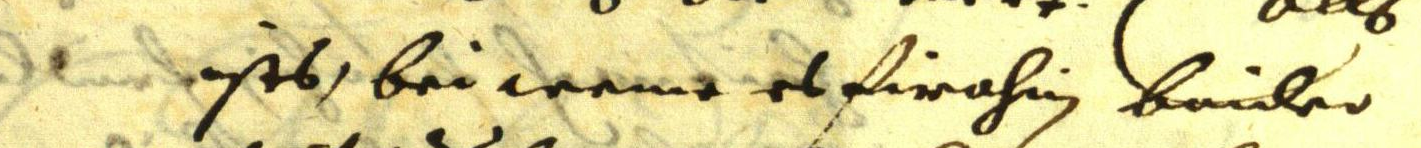ists, bei weme es firohin baider
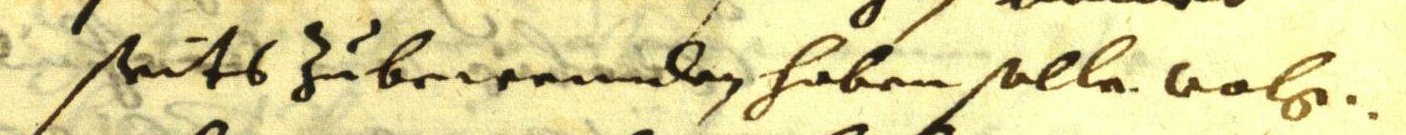seits Zū bewenden haben solle. volg¬
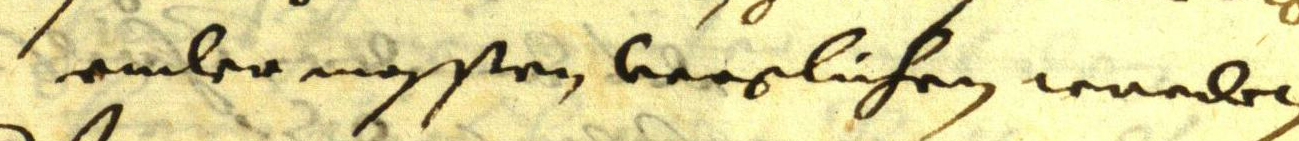ender massen verglichen worden.
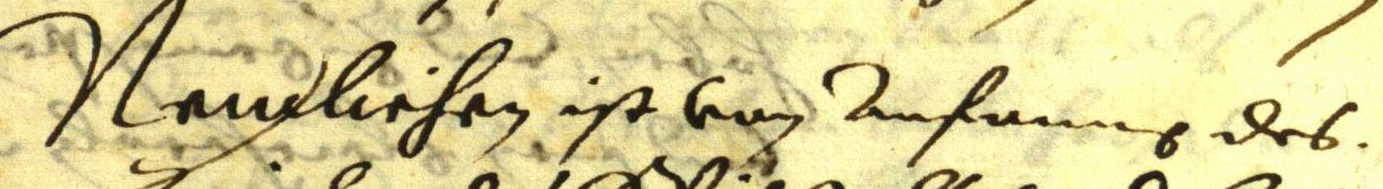Nemblichen ist von Anfanng des.
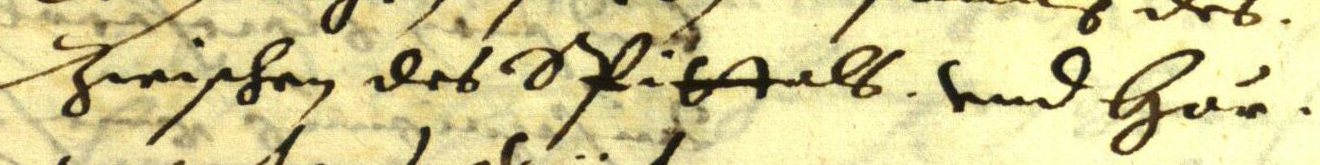Zwischen des SPittals. vnd Hōr¬
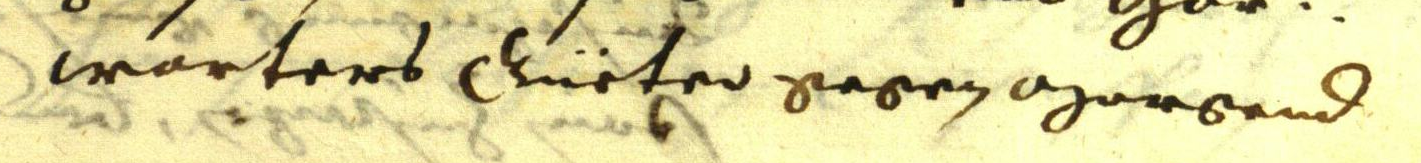warters Güeter gegen Morgend
